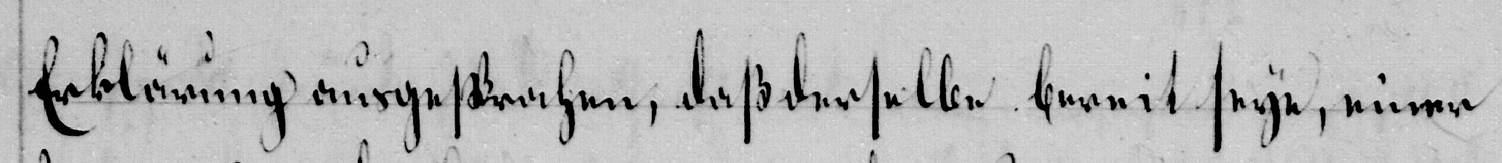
Erklärung ausgesprochen, daß derselbe bereit seye, einer
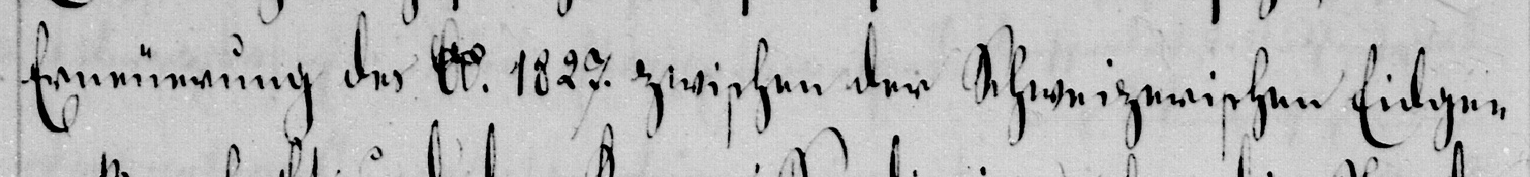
Erneuerung des Ao. 1827. zwischen der Schweizerischen Eidge¬
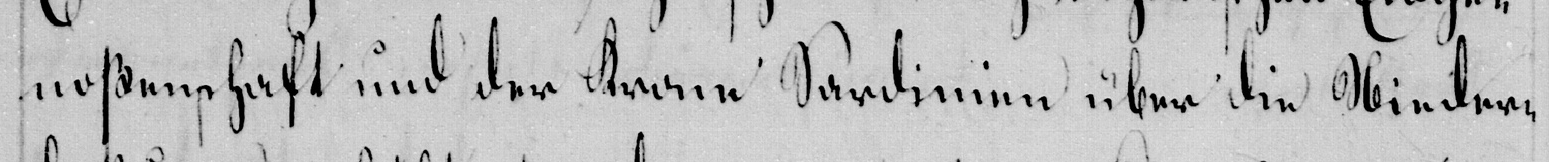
noßenschaft und der Krone Sardinien über die Nieder¬
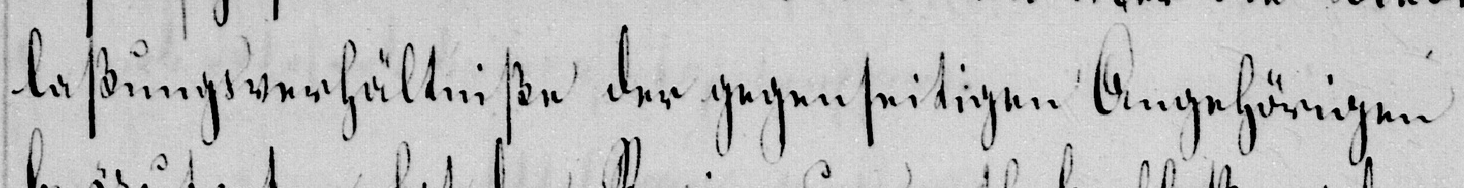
laßungsverhältniße der gegenseitigen Angehörigen
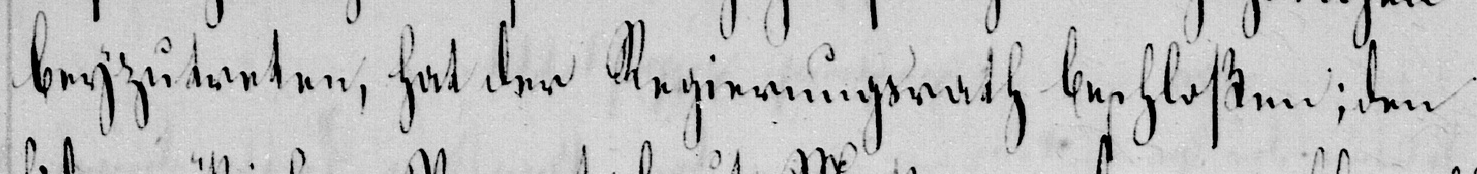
beyzutreten, hat der Regierungsrath beschloßen; den
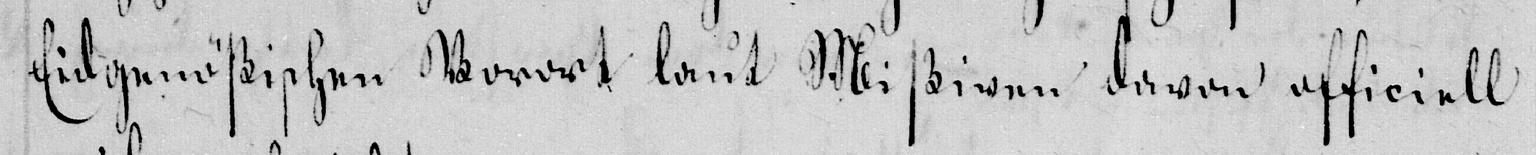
Eidgenößischen Vorort laut Mißiven davon officiell
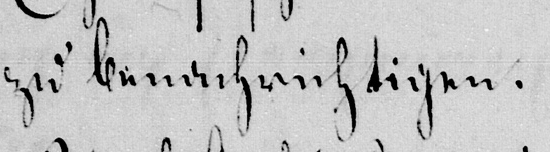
zu benachrichtigen.
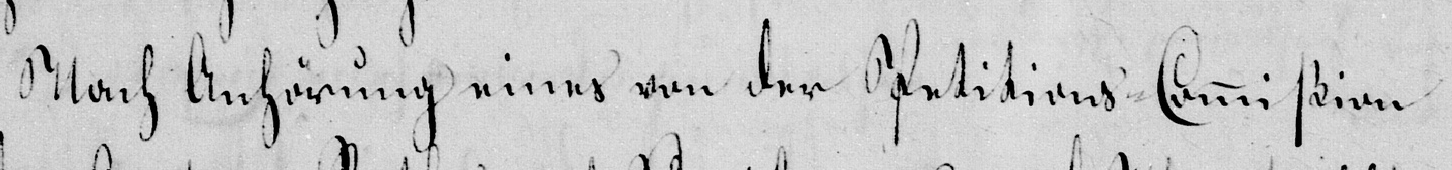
Nach Anhörung eines von der Petitions-Commißion
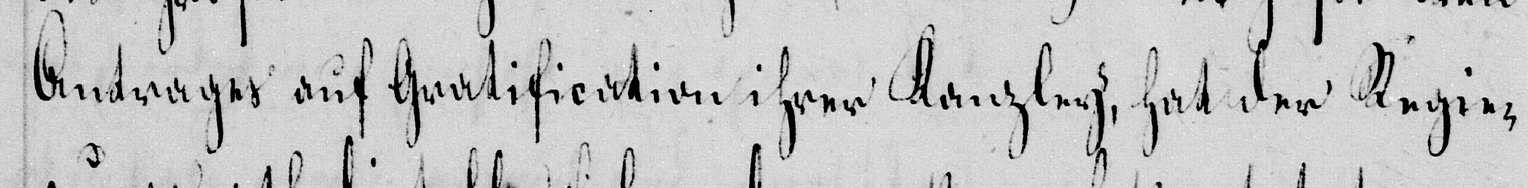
Antrages auf Gratification ihrer Kanzley, hat der Regie¬
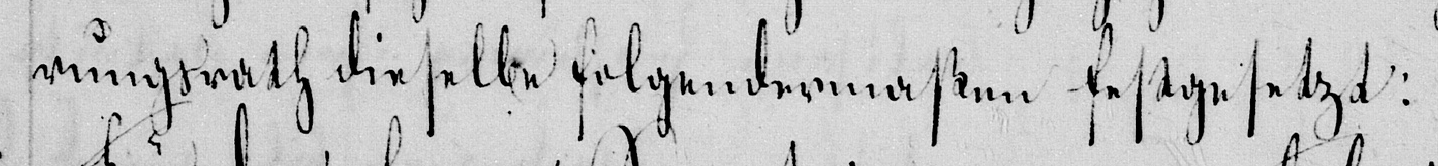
rungsrath dieselbe folgendermaßen festgesetzt:
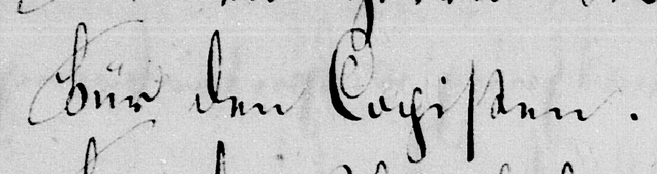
Für den Copisten
